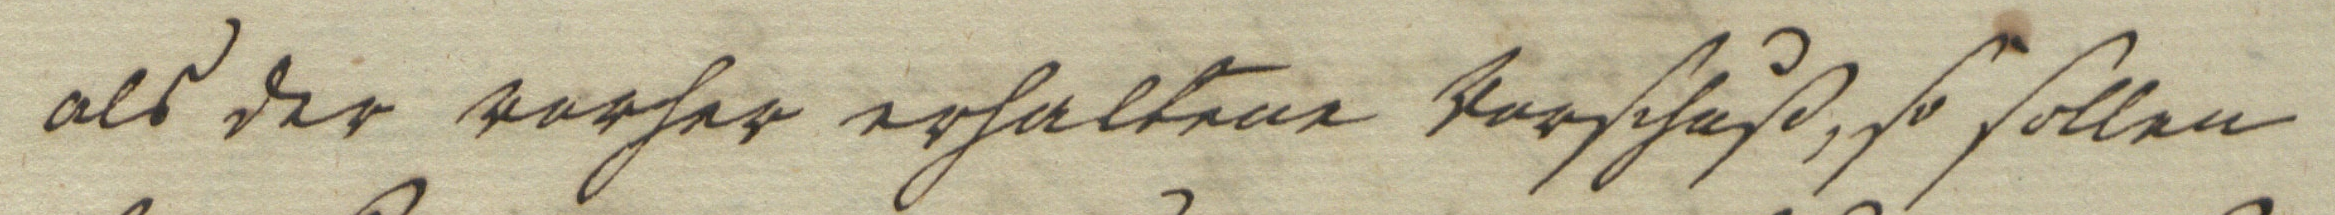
als der vorher erhaltene Vorschuß, so sollen
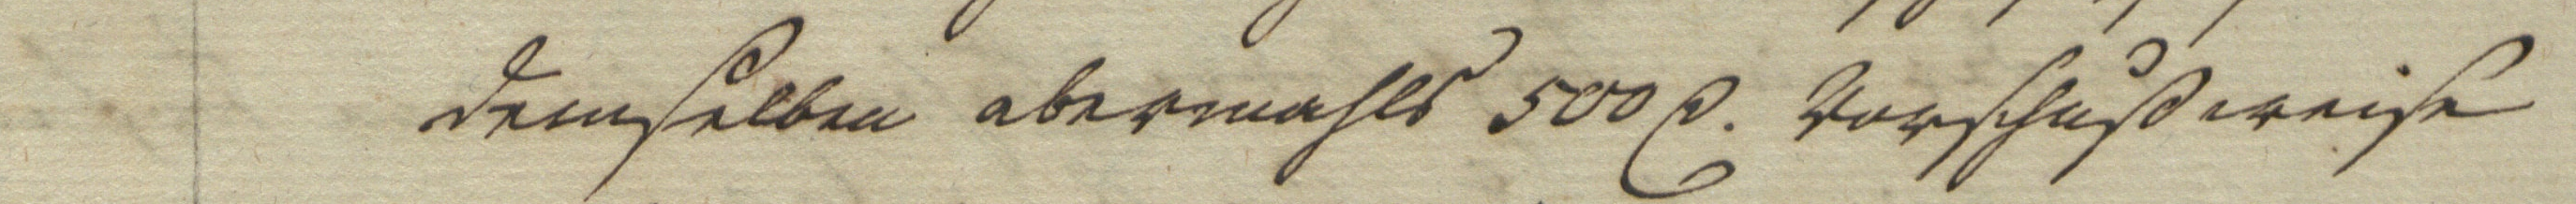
demselben abermahls 500 rtl. vorschußweise
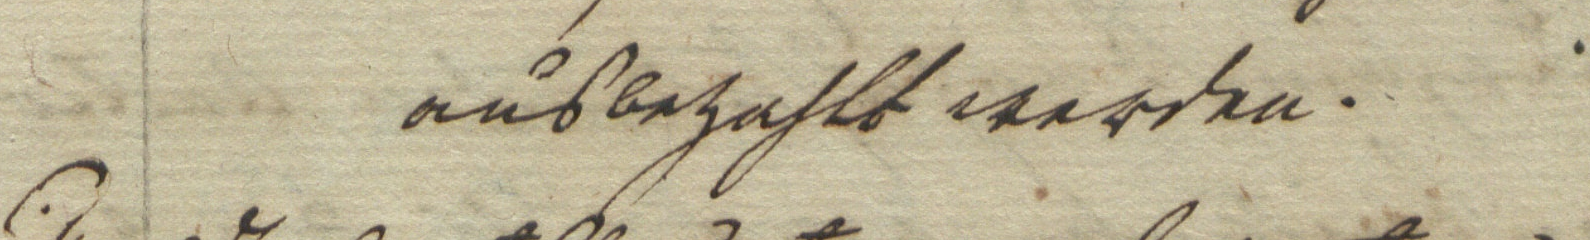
ausbezahlt werden.
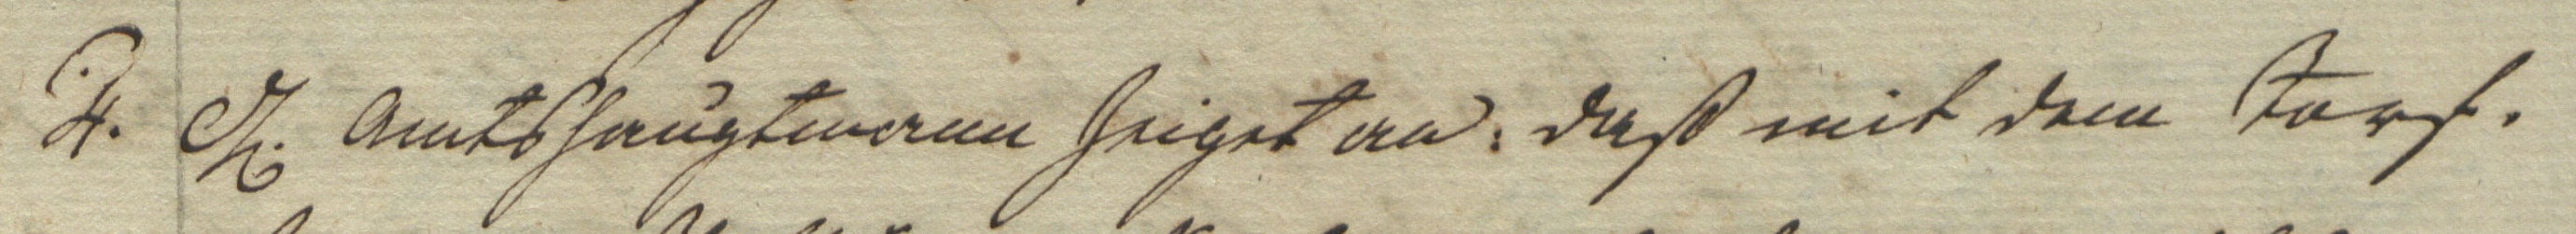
4. dh. Amtshauptmann zeiget an: daß mit dem Torf¬
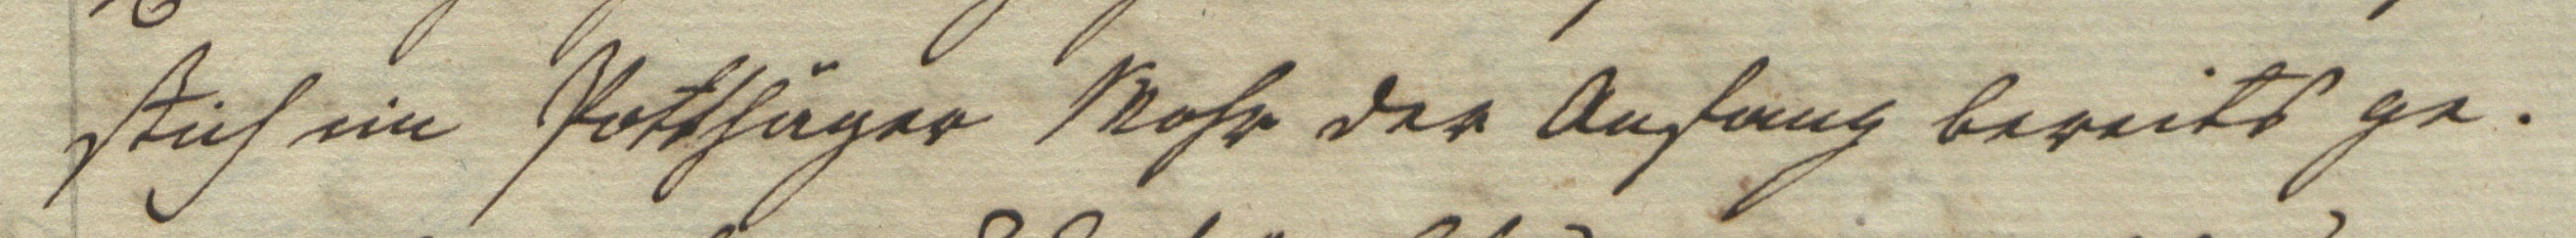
stich im Potthäger Mohr der Anfang bereits ge¬
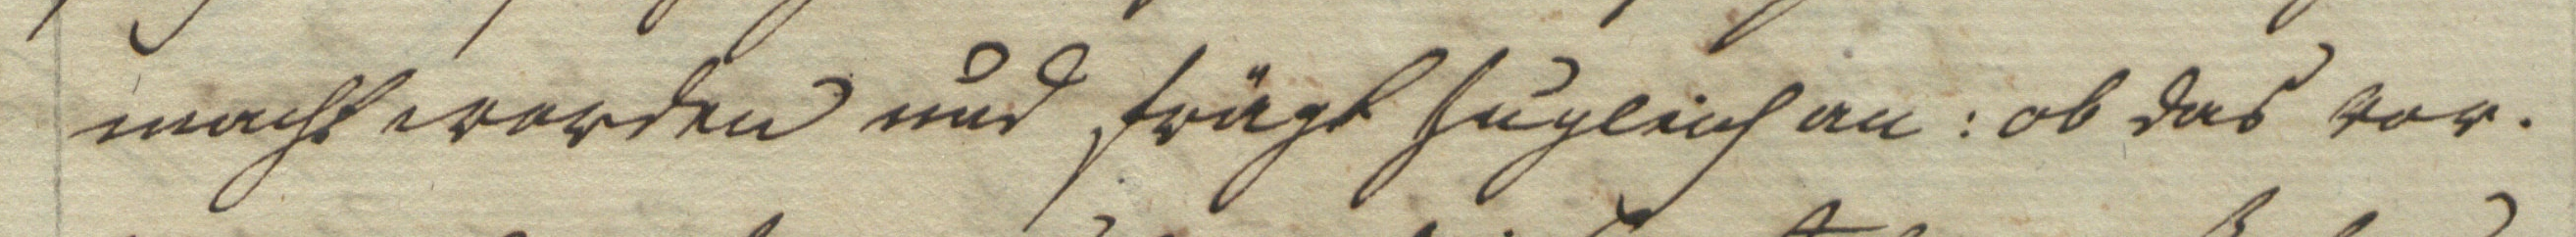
macht worden und frägt zugleich an: ob das vor¬
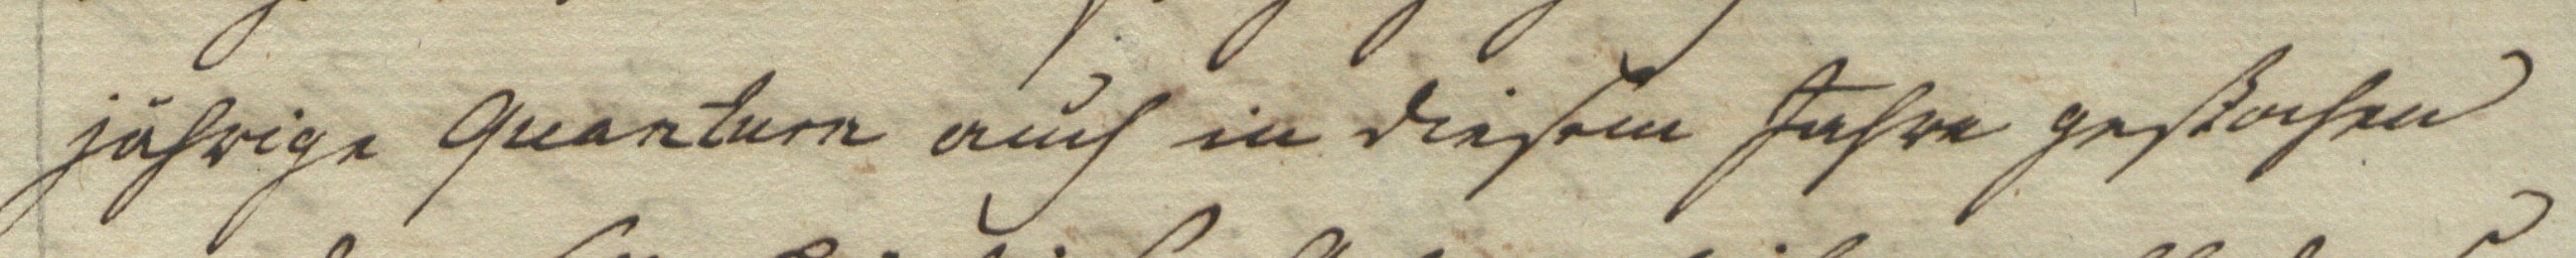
jährige Quantum auch in diesem Jahre gestochen
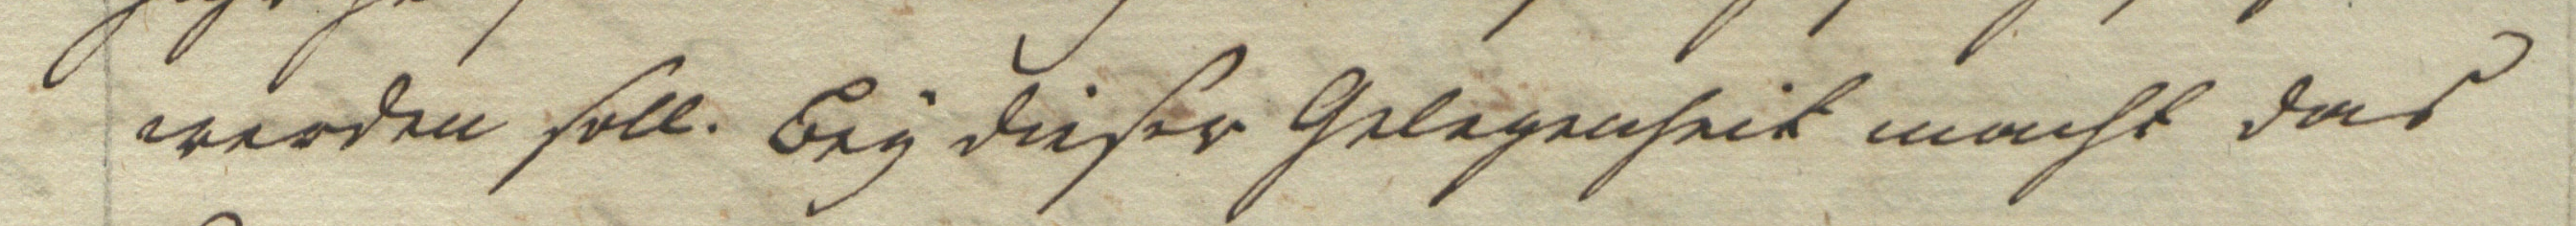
werden soll. Bey dieser Gelegenheit macht das
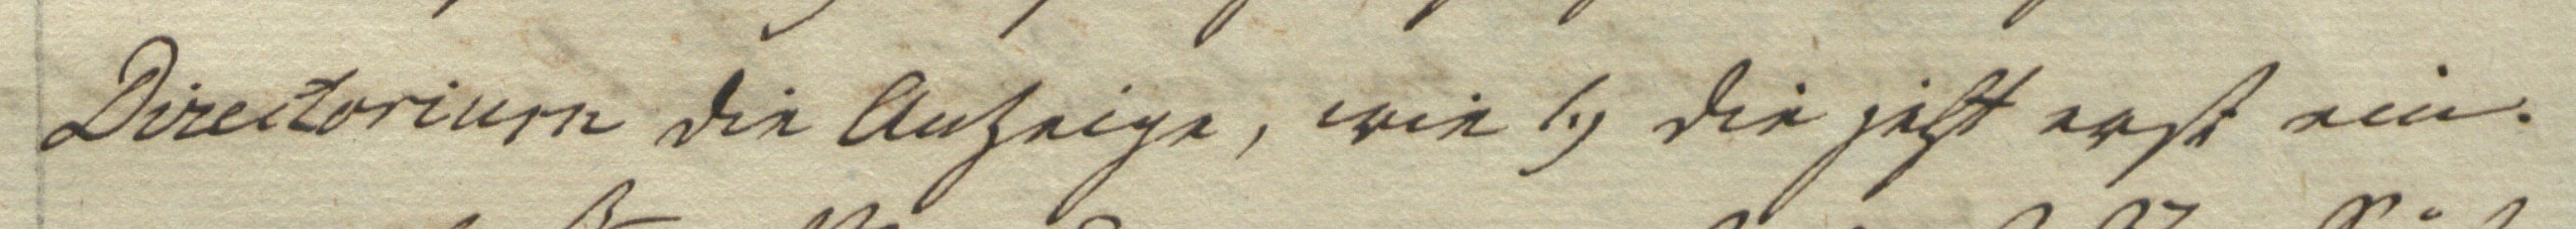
Directorium die Anzeige, wie 1., die jetzt erst ein¬
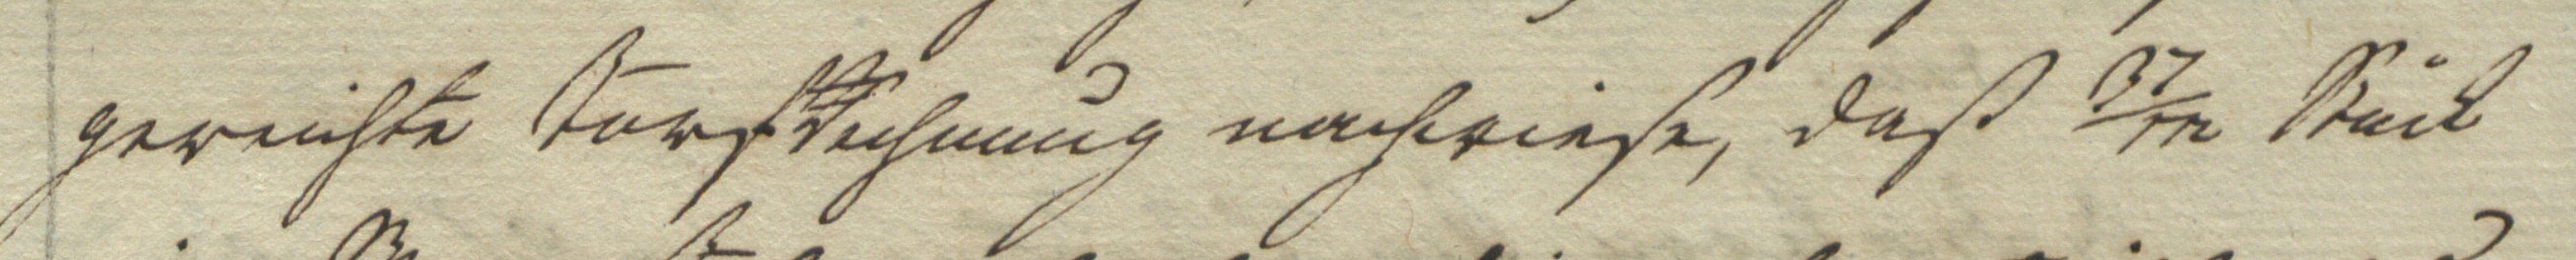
gereichte Torf Rechnung nachweise, daß 37/m Stück
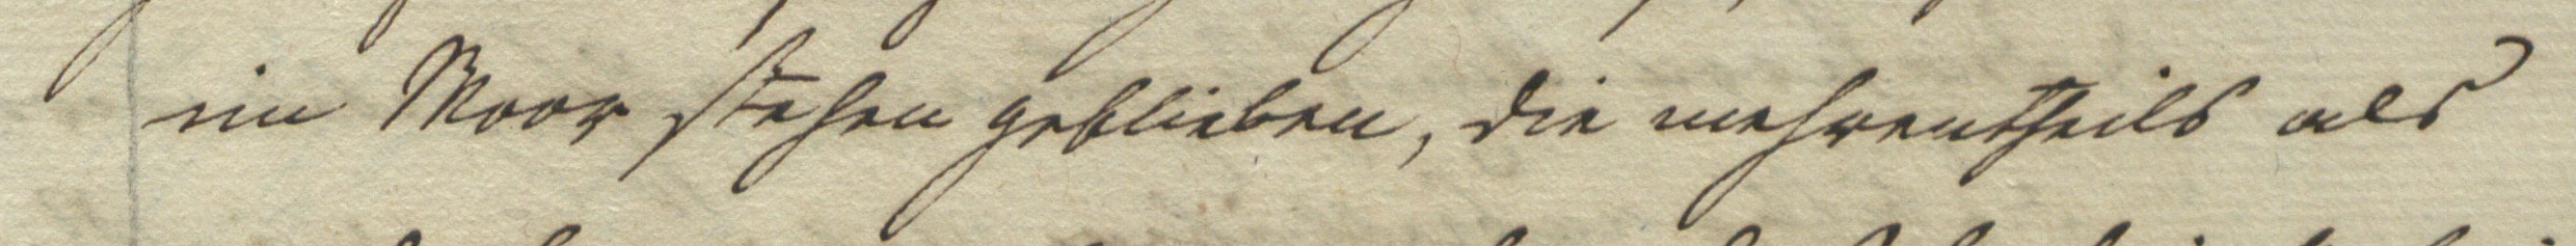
im Moor stehen geblieben, die mehrentheils als
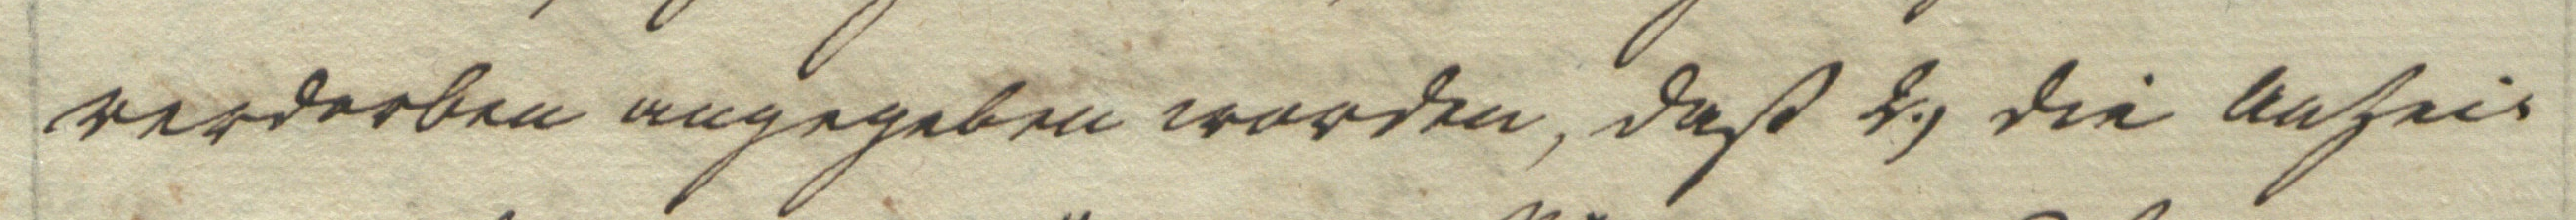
verdorben angegeben worden, daß 2., die Anzei¬
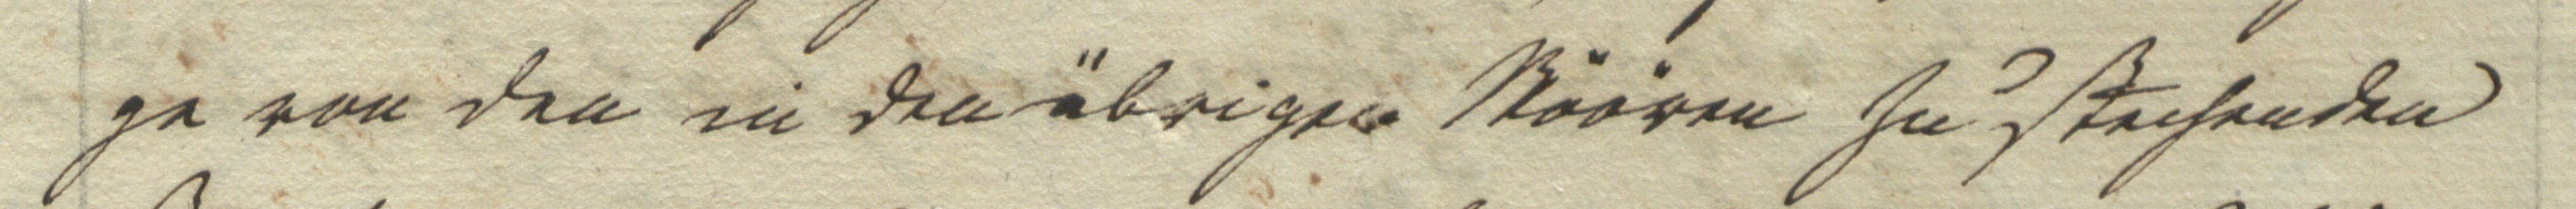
ge von den in den übrigen Möören zu stechenden
